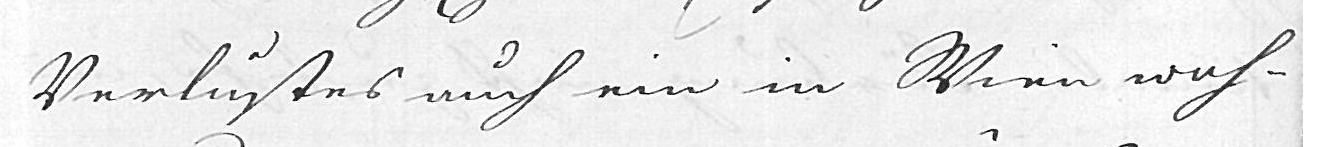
Verlustes auch ein in Wien woh-
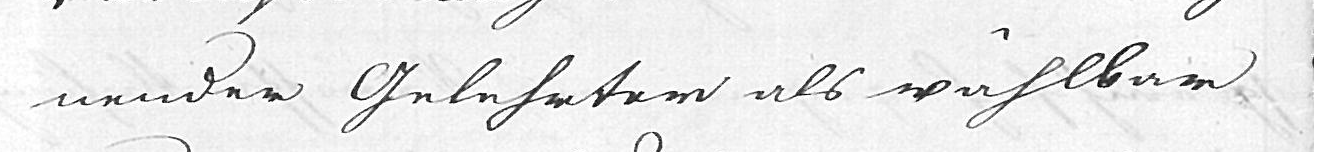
nender Gelehrter als wählbar
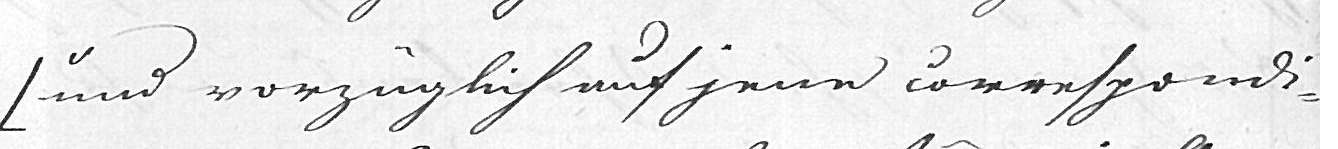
und vorzüglich auf jene correspondi-
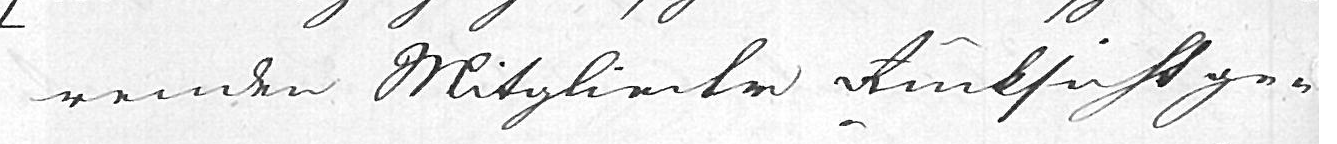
renden Mitglieder Rücksicht ge-
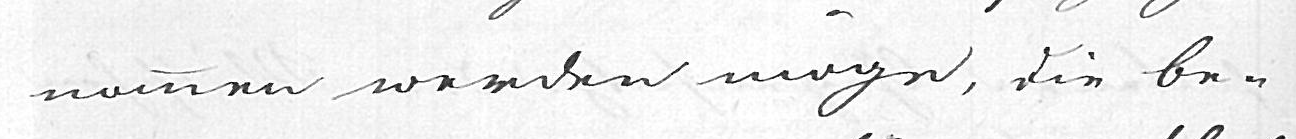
nommen werden möge, die be-
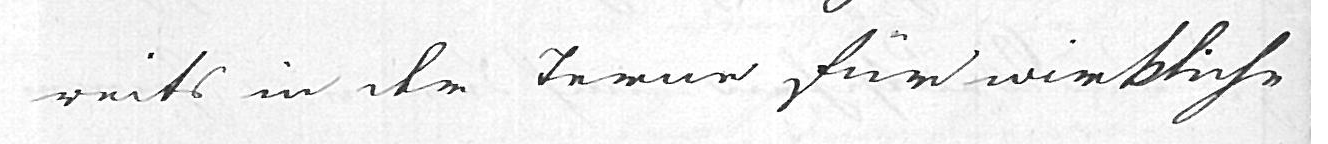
reits in der Terne für wirkliche
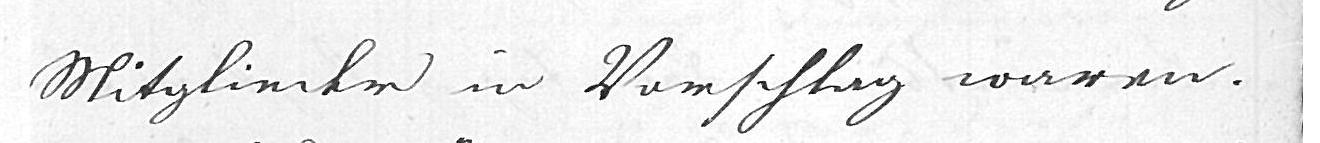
Mitglieder in Vorschlag waren.
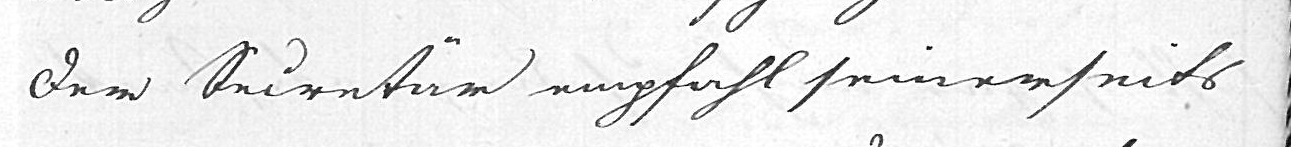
Der Secretär empfahl seinerseits
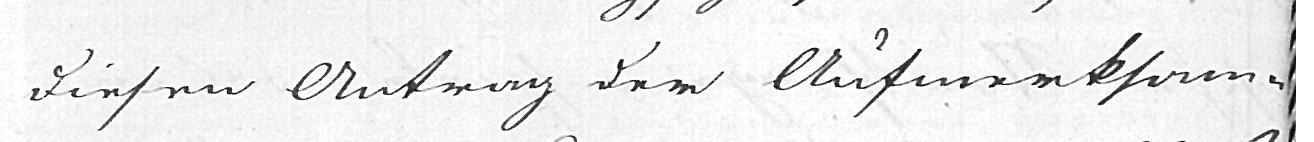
diesen Antrag der Anfmerksam-
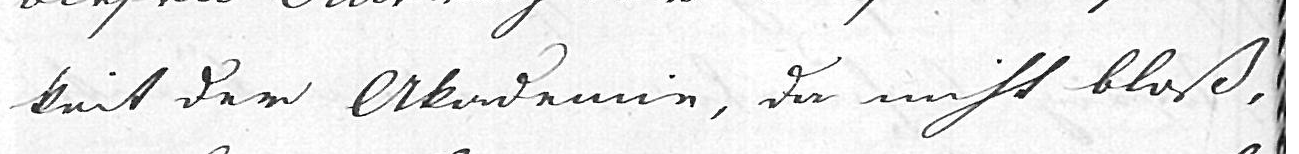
keit der Akademie, da nicht bloß,
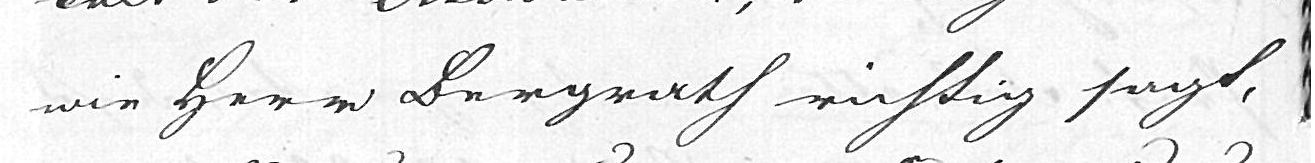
wie Herr Bergrath richtig sagt,
